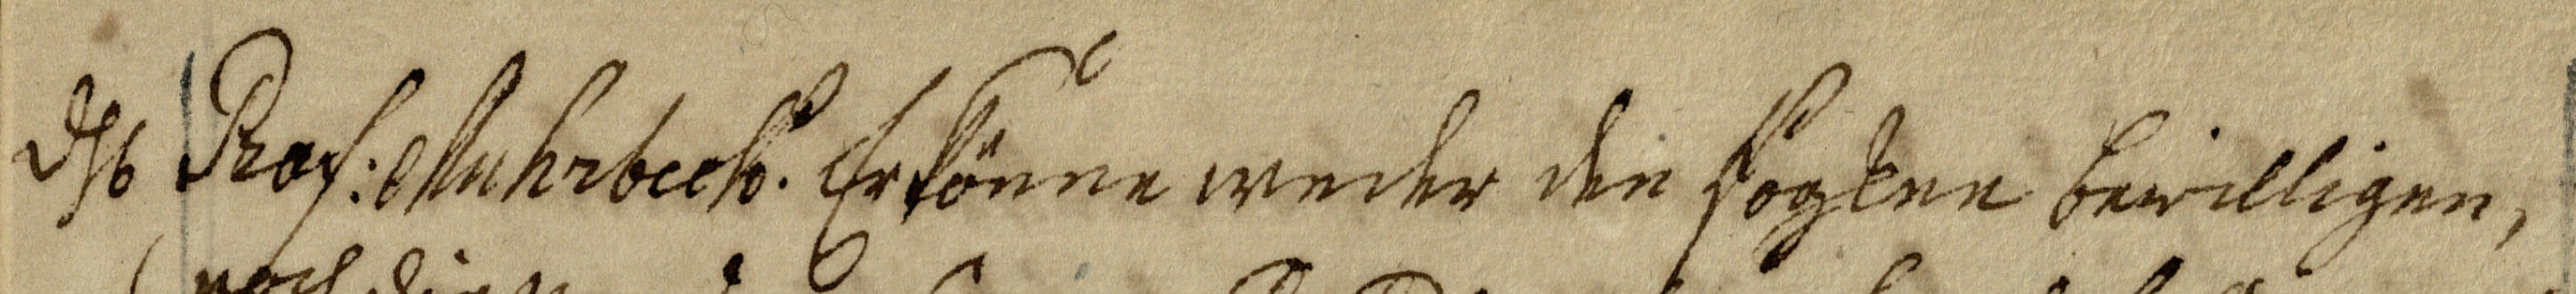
dh. Prof. Muhrbeck. Er könne weder den Rogken bewilligen,
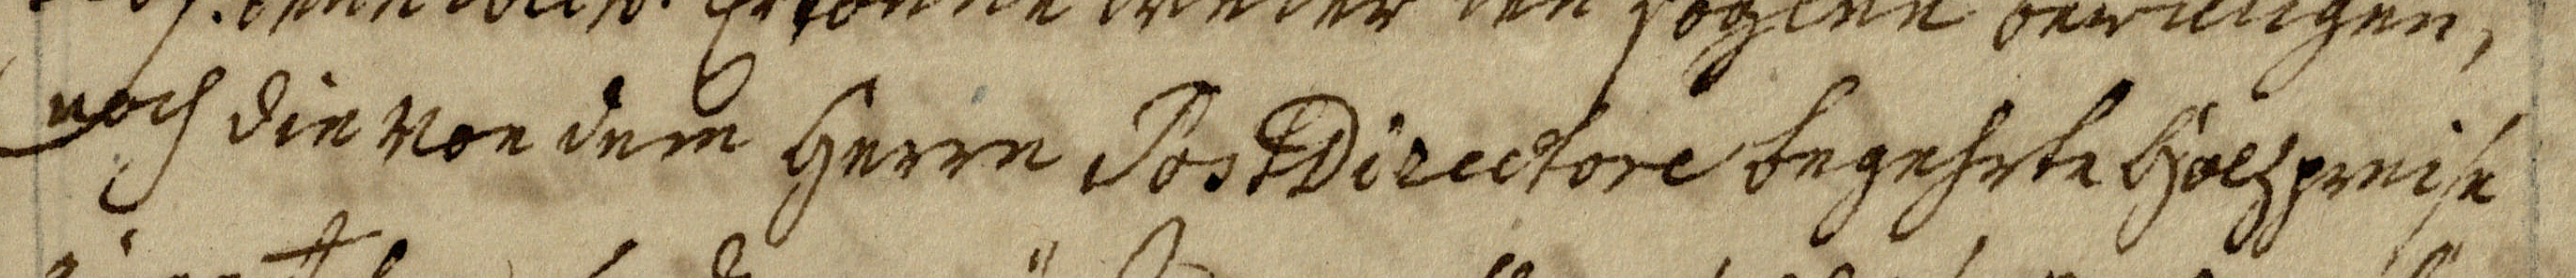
noch die von dem Herrn PostDirectore begehrte Holzpreise
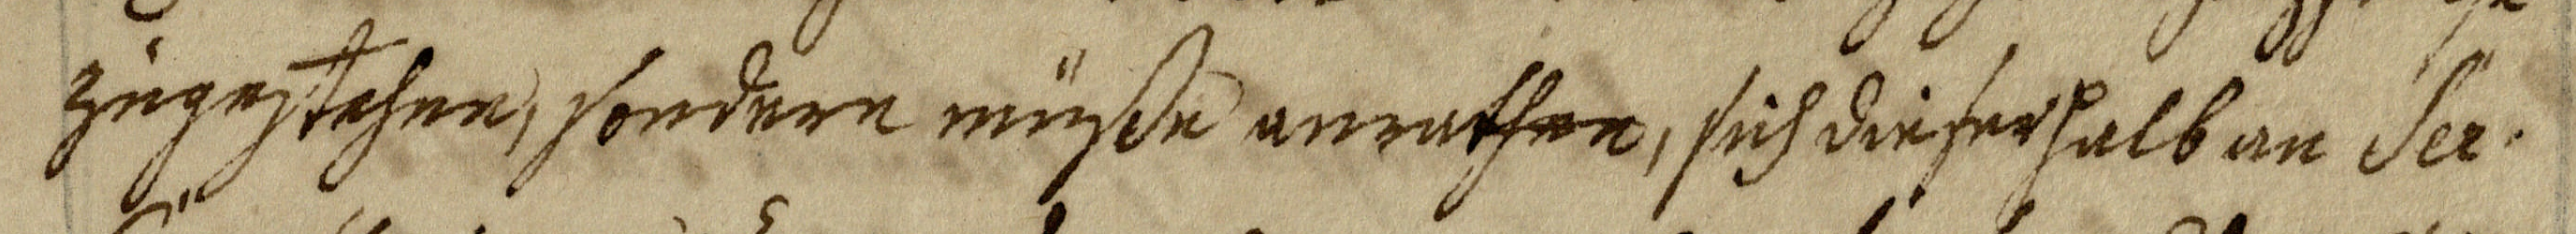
zugestehen, sondern müße anrathen, sich dieserhalb an Sr.
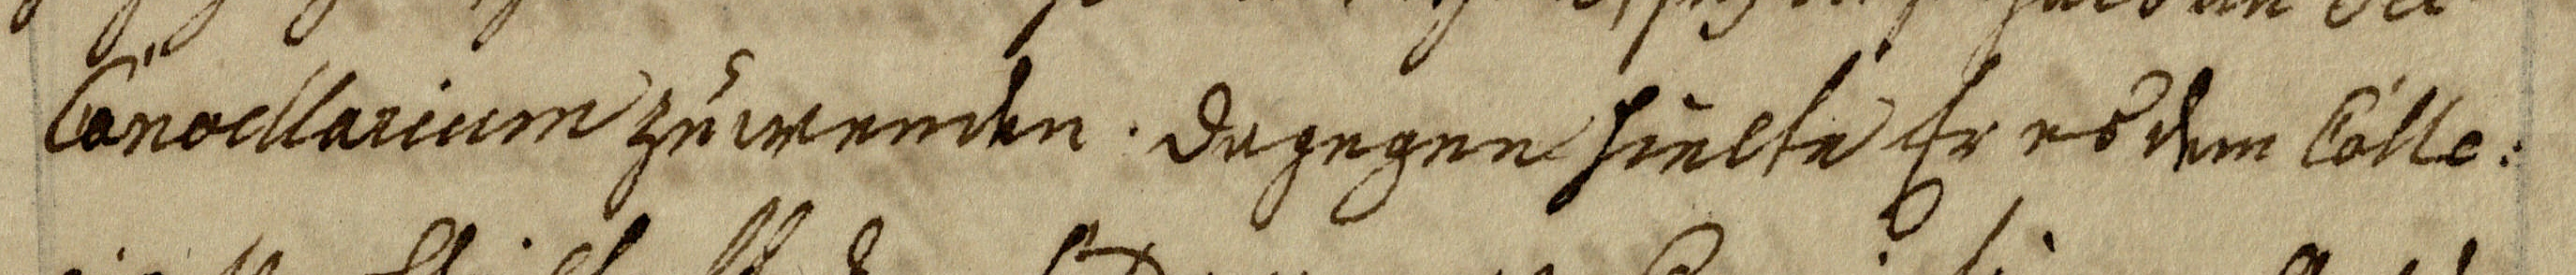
Cancellarium zu wenden. Dagegen hielte Er es dem Colle¬
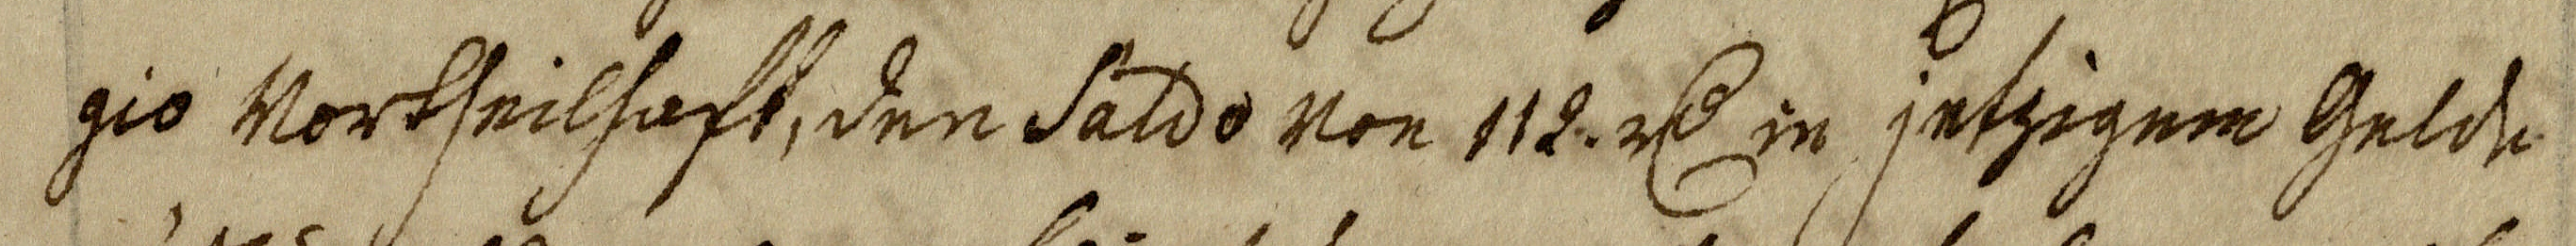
gio vortheilhaft, den Saldo von 112. rt in jetzigem Gelde
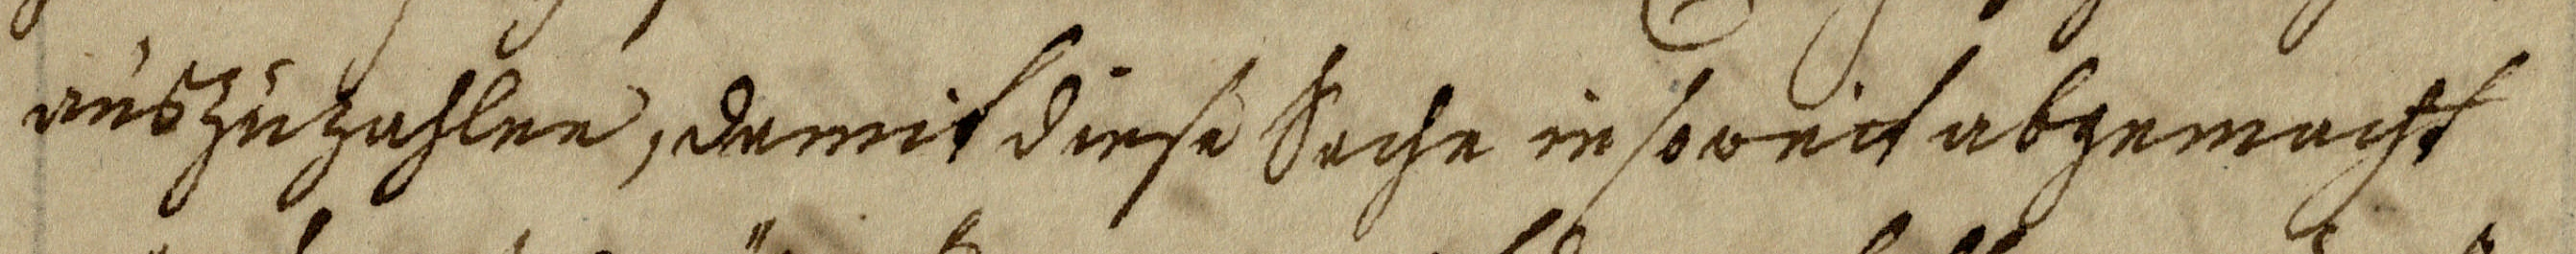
auszuzahlen, damit diese Sache in soweit abgemacht
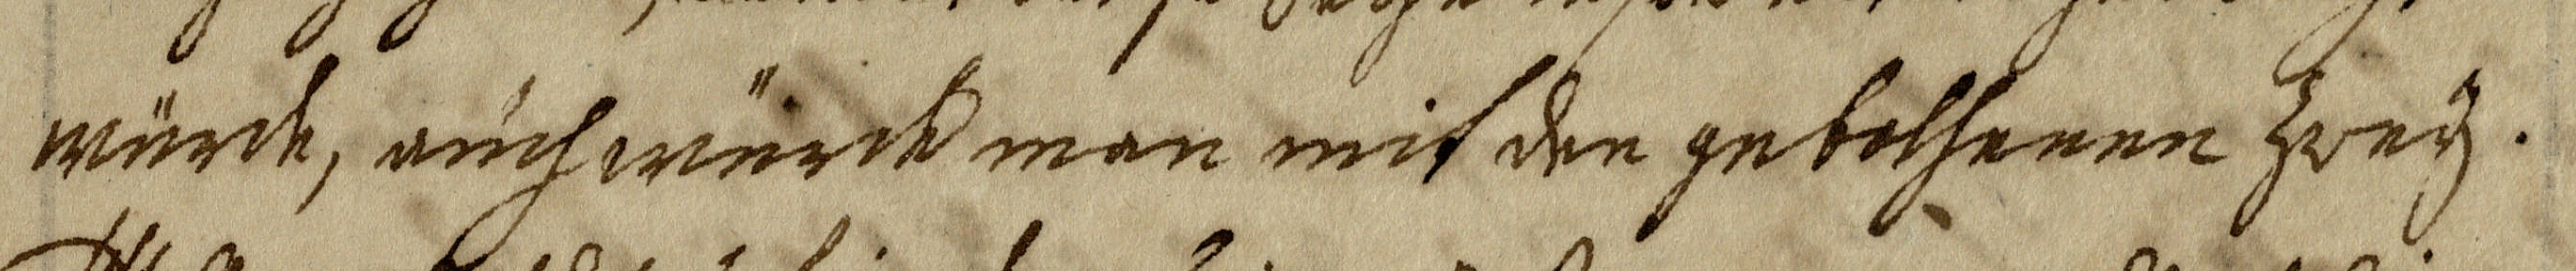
würde, auch würde man mit den gebothenen zweÿ
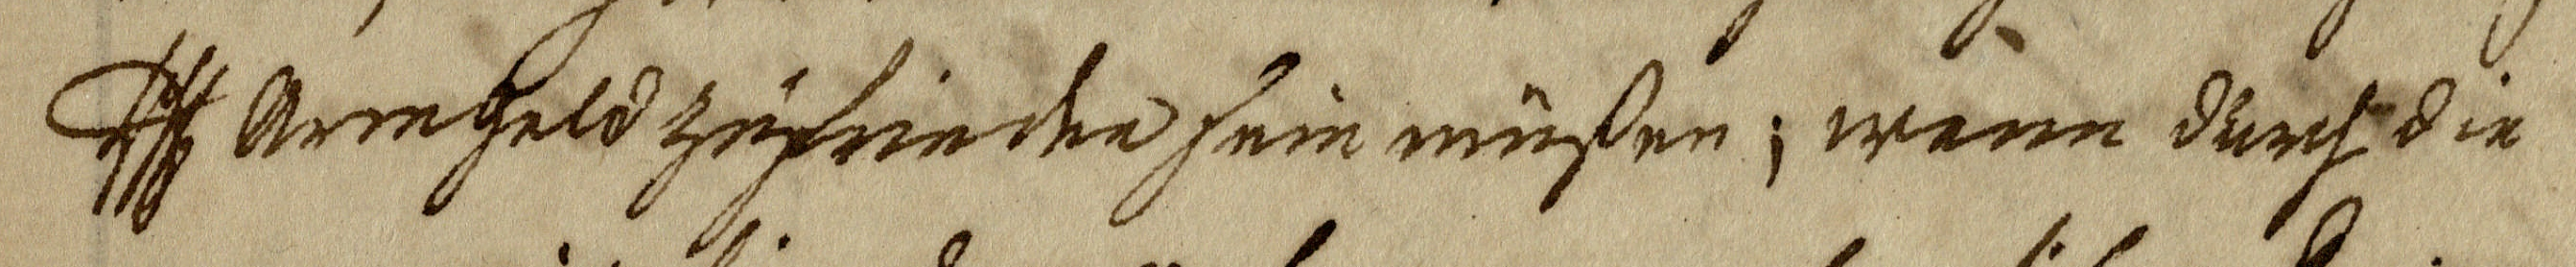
Rt Armgeld zufrieden sein müßen, wenn durch die
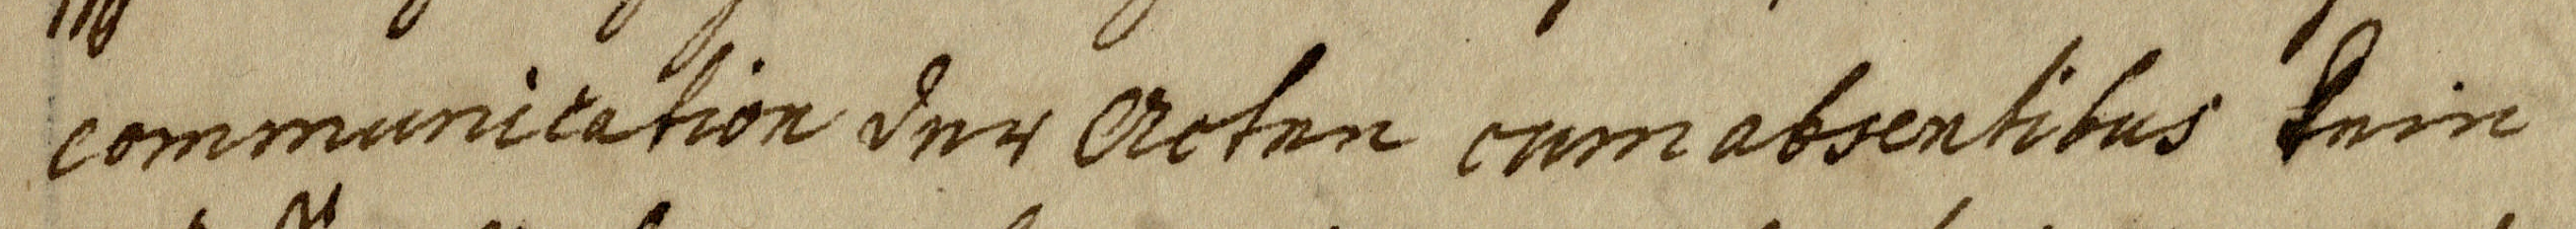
communication der Acten cum absentibus kein
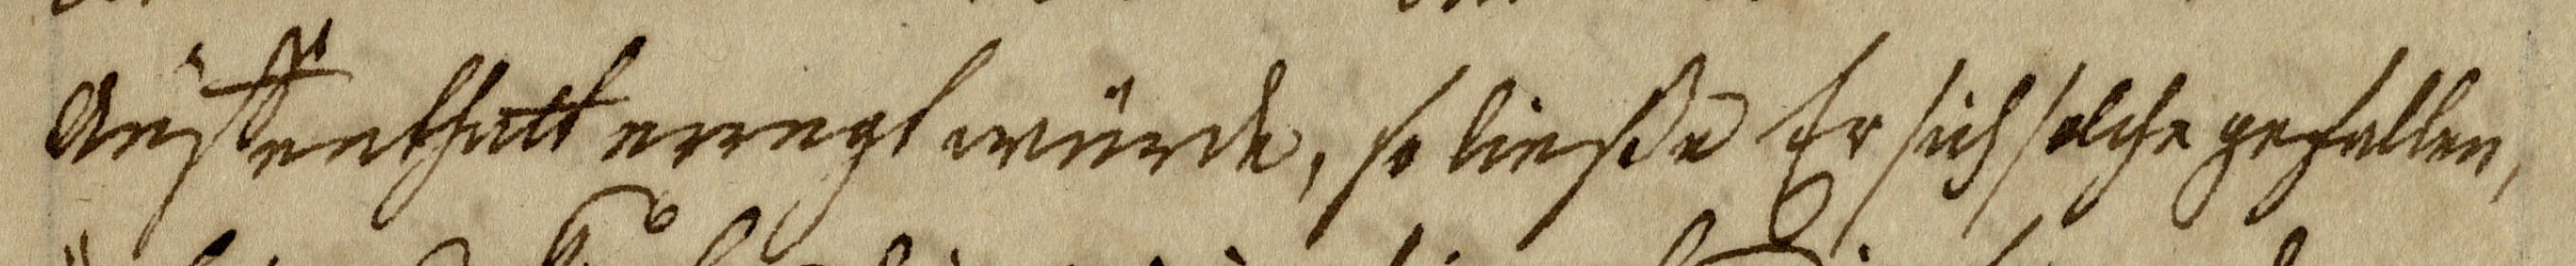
Aufenthalt erregt würde, so ließe Er sich solche gefallen,
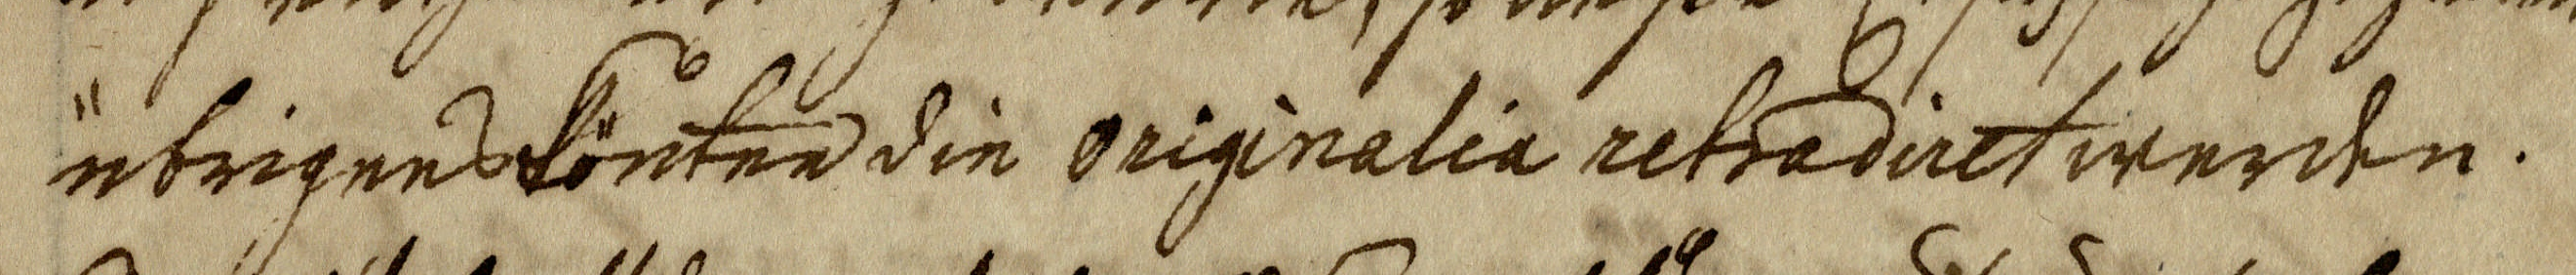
übrigens könten die originalia retradiret werden.
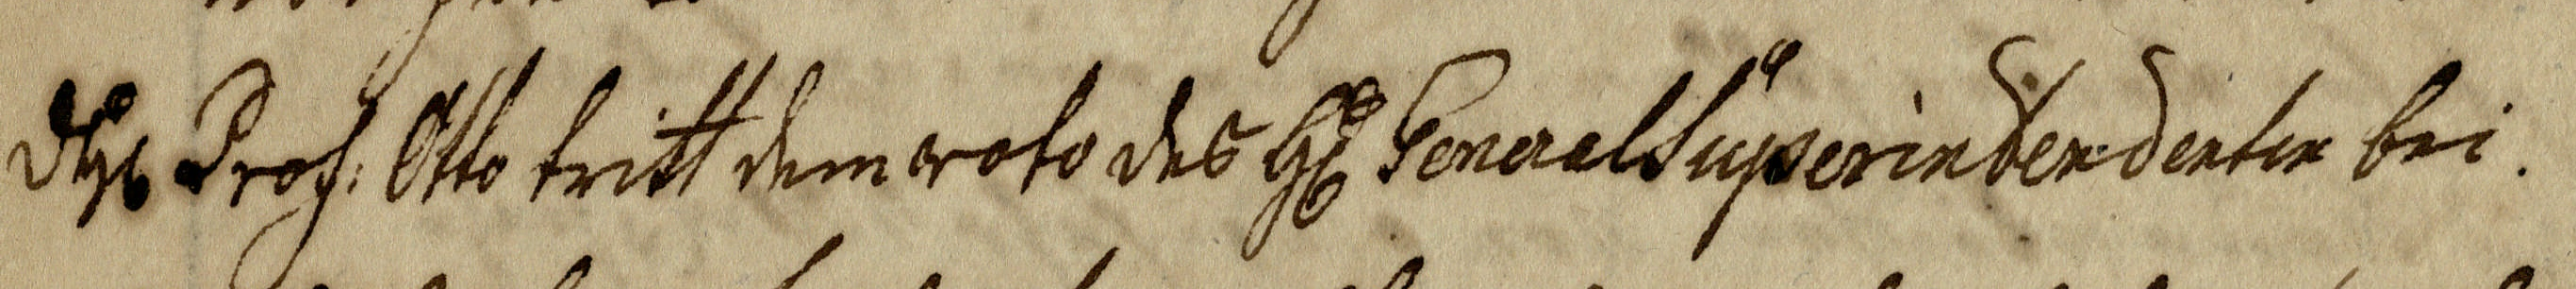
dh Prof. Otto tritt dem voto des H. GenerallSuperintendenten bei.
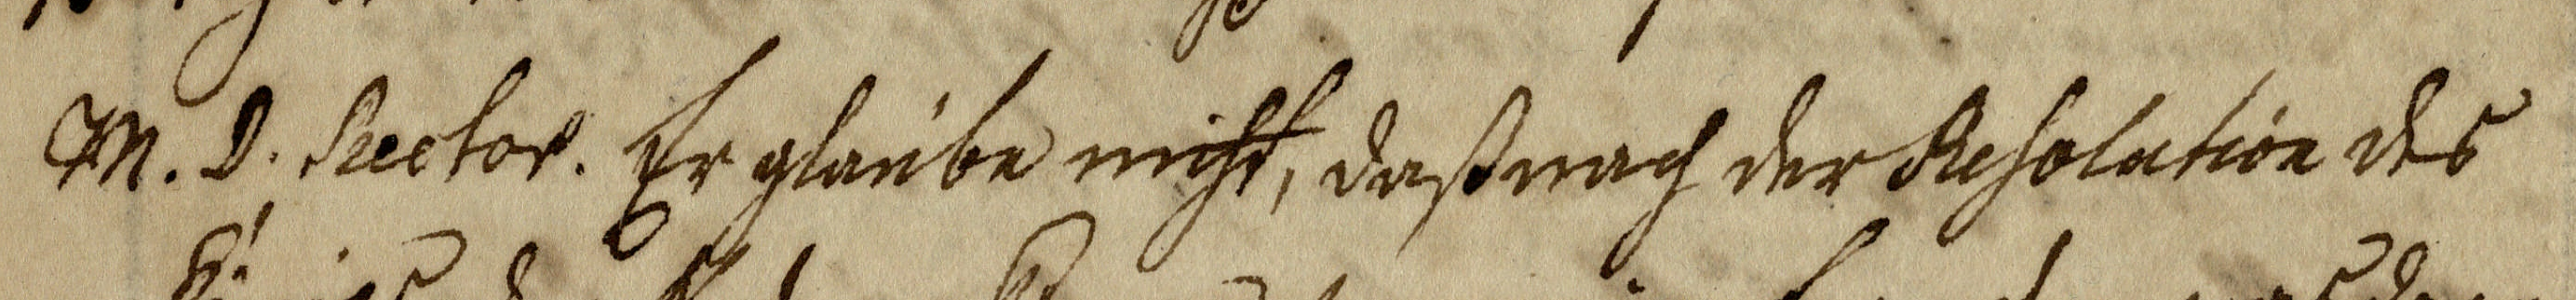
M. D. Rector. Er glaube nicht, daß nach der Resolution des
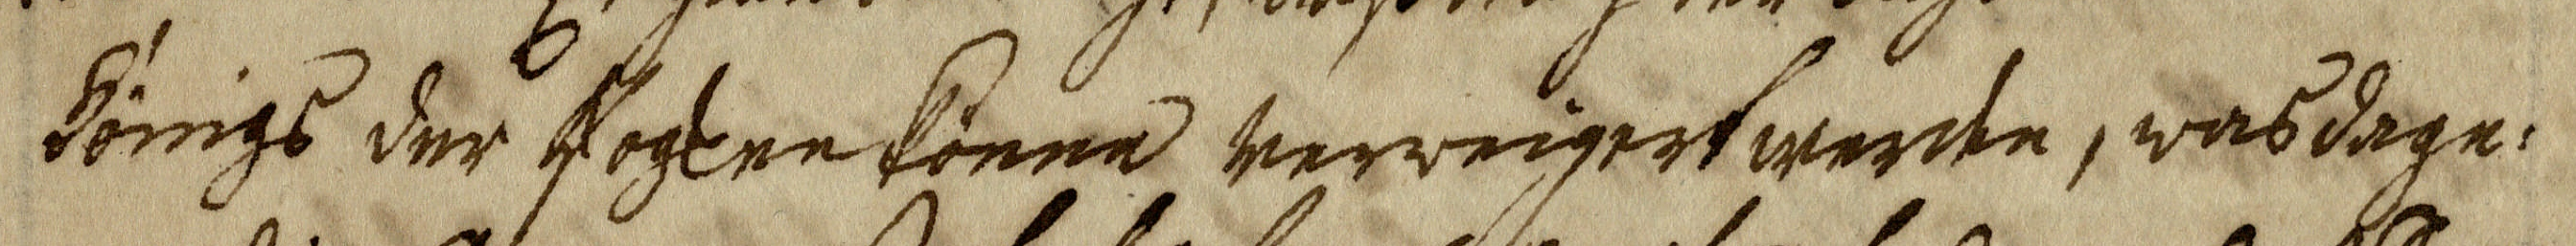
Königs der Rogken könne verweigert werden, was dage¬
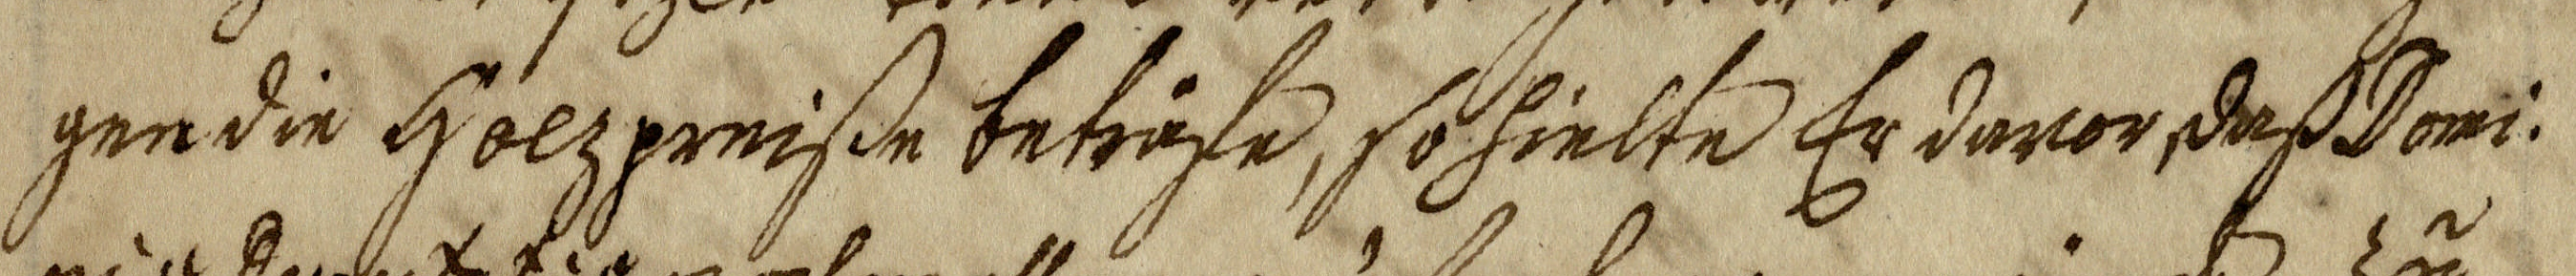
gen die Holzpreiße beträfe, so hielte Er davor, daß Domi¬
